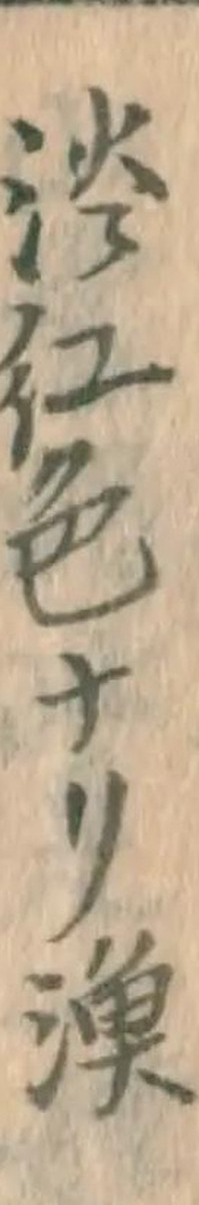淡紅色ナリ漁
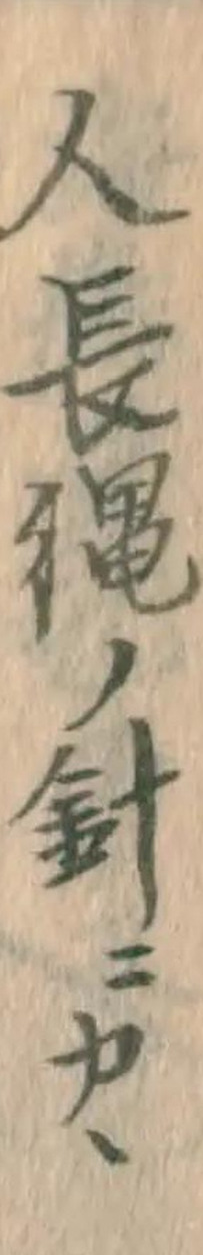人長縄ノ針ニカヽ
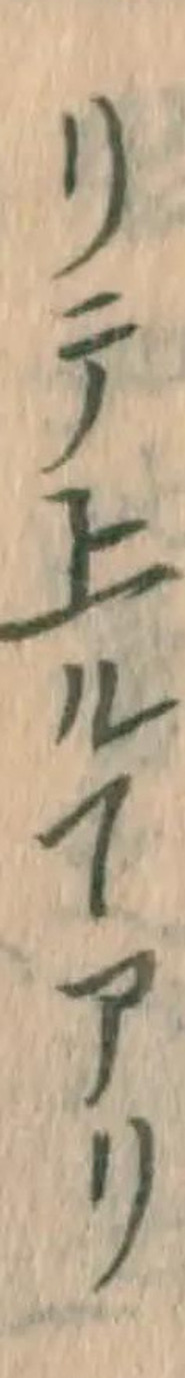リテ上ルコトアリ
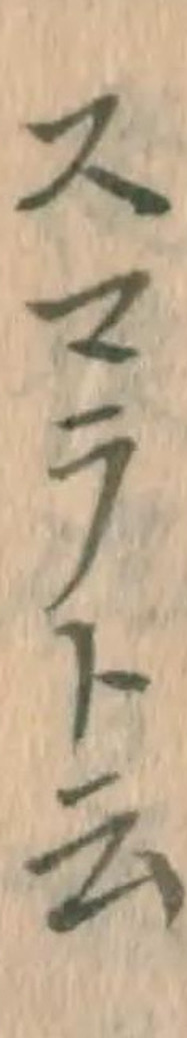スマラト云
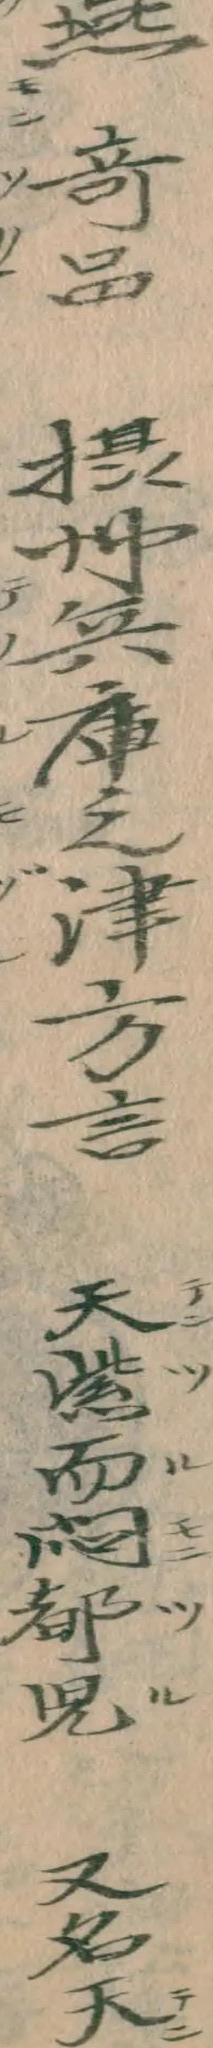△海燕奇品摂州兵庫之津方言天紫而悶都児又名天紫
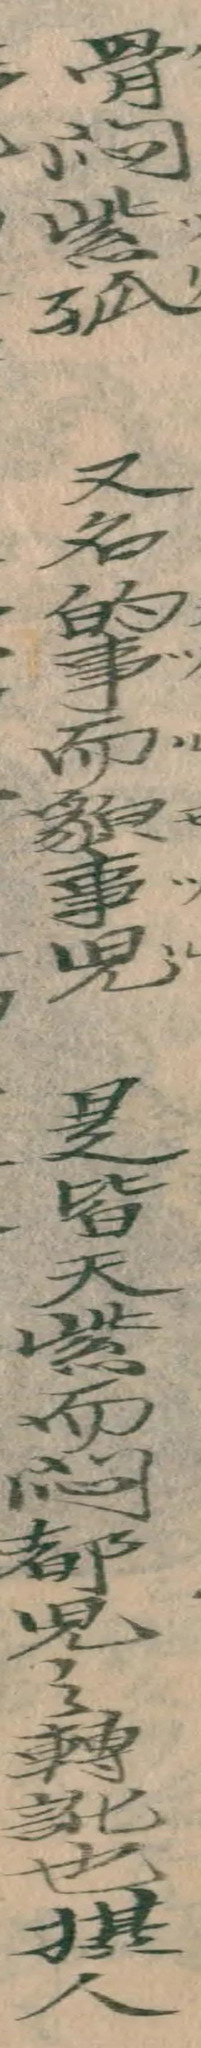骨悶紫孤又名的事而貌事児是皆天紫而悶都児之轉訛也摂人
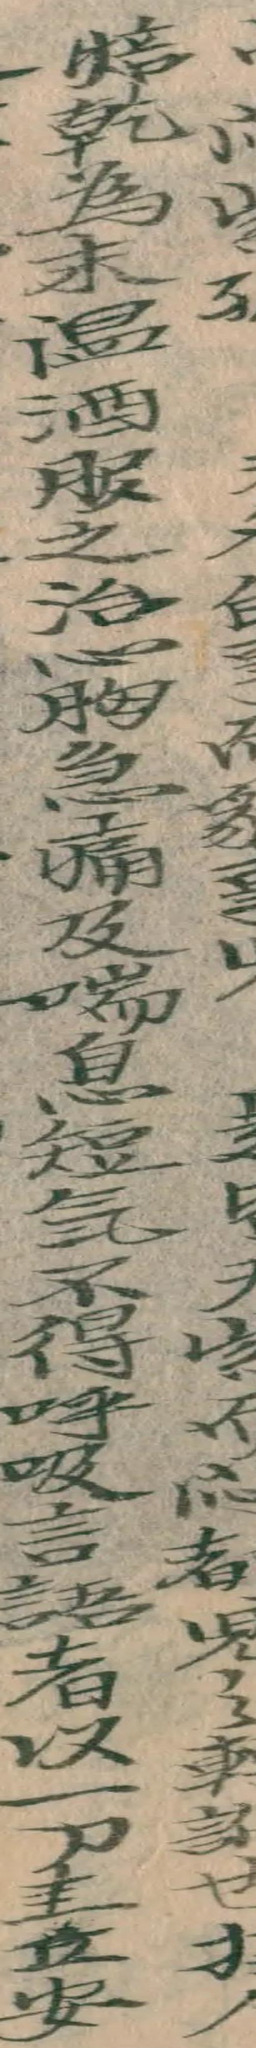焙乾為末温酒服之治心胸急痛及喘息短気不得呼吸言語者以一刀圭立安
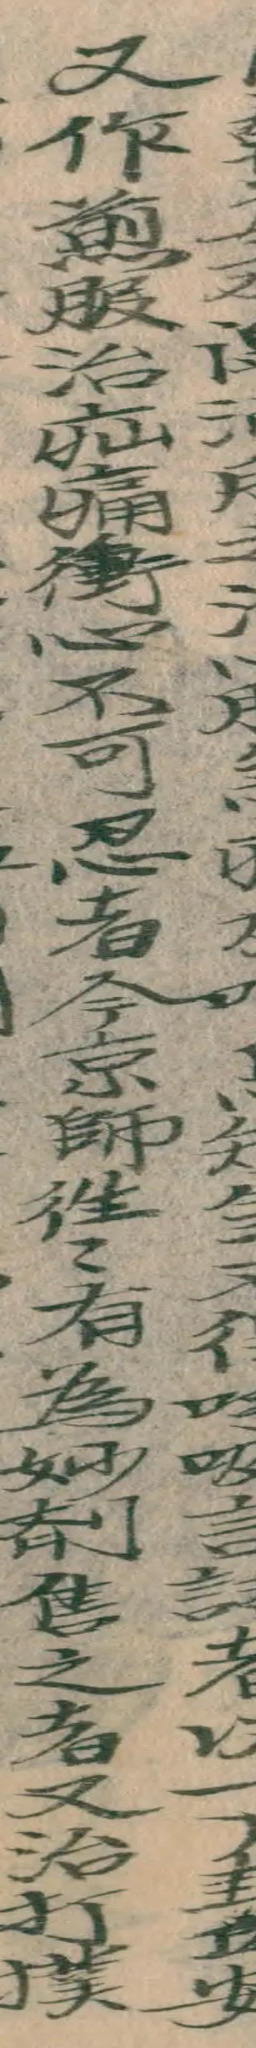又作煎服治疝痛衝心不可忍者今京師往々有為妙剤售之者又治打撲
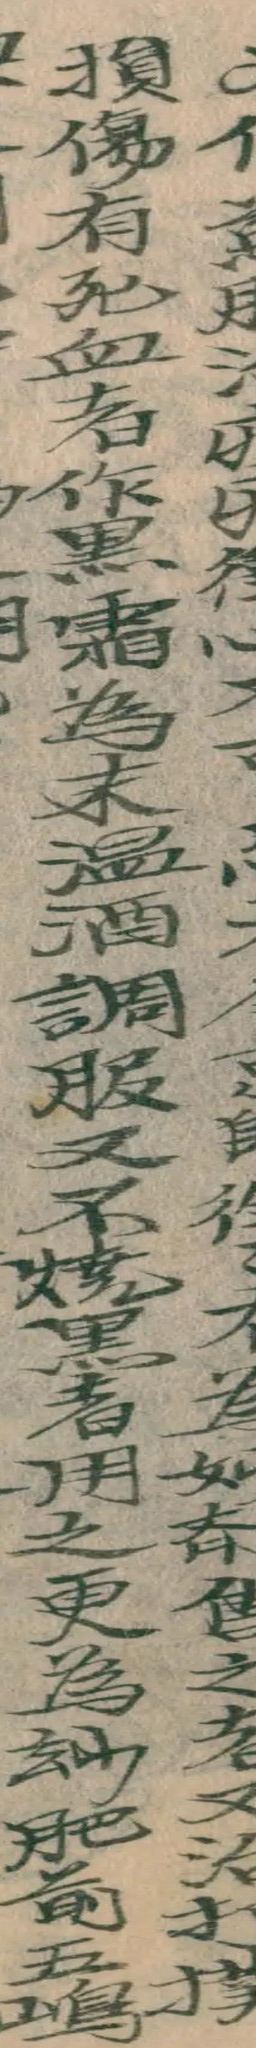損傷有死血者作黒霜為末温酒調服又不焼黒者用之更為玅肥前五嶋
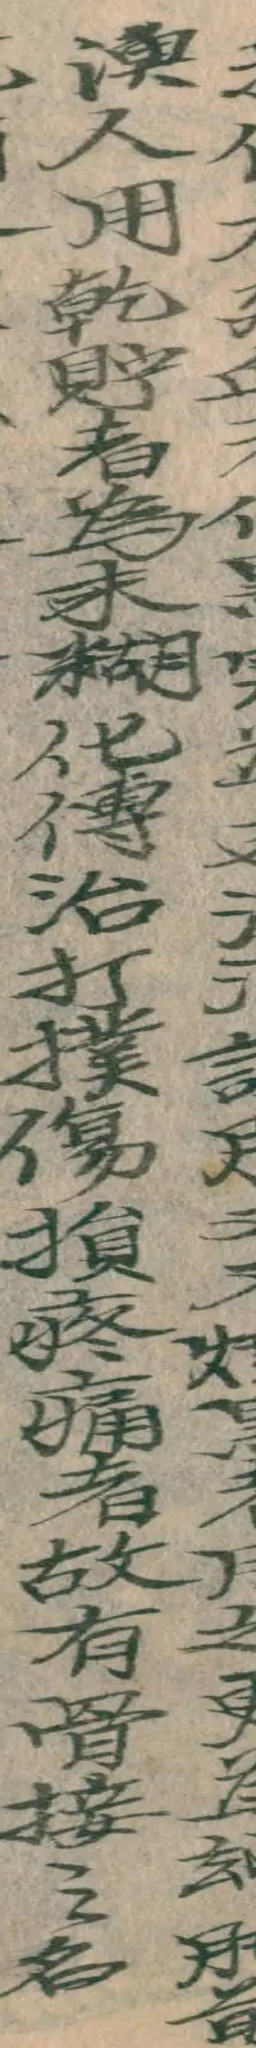漁人用乾貯者為末糊化傳治打撲傷損疼痛者故有骨接之名
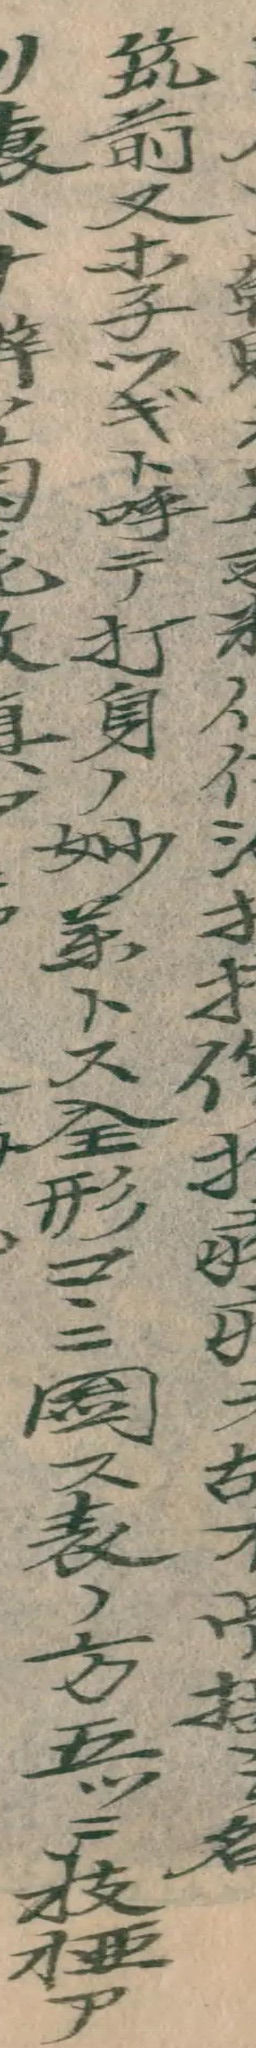筑前又ホネツギト呼テ打身ノ妙薬トス全形コヽニ圖ス表ノ方五ツニ枝椏ア
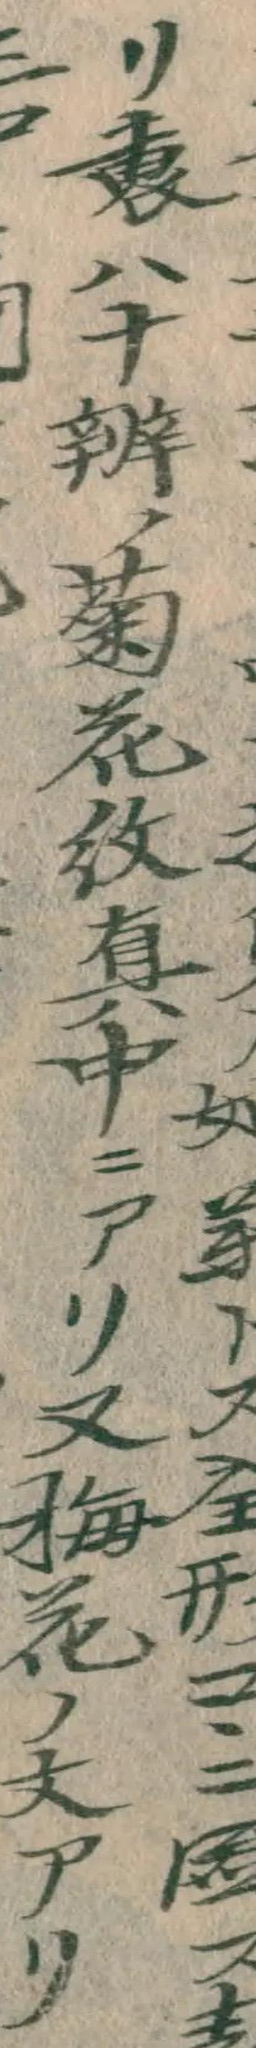リ裏ハ十辨ノ菊花紋真中ニアリ又梅花ノ文アリ
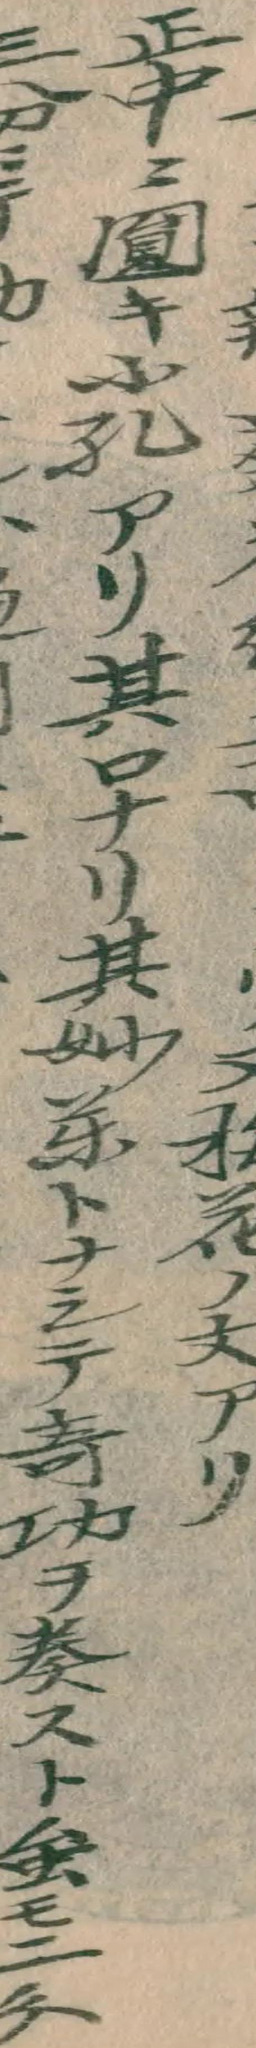正中ニ圓キ小孔アリ其口ナリ其妙薬トナシテ奇功ヲ奏スト虽モ二分
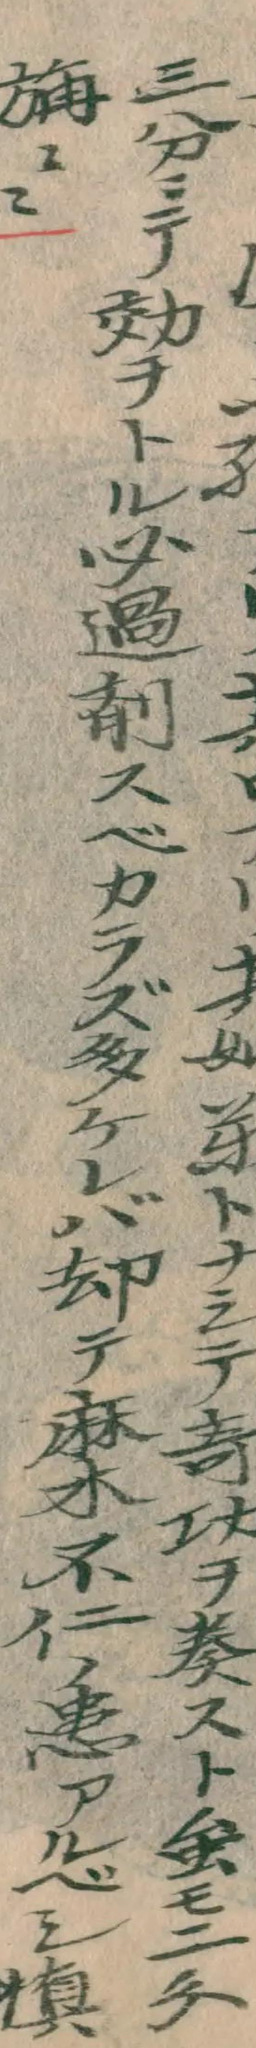三分ニテ効ヲトル必過剤スベカラズ多ケレバ却テ麻木不仁ノ患アルベシ慎
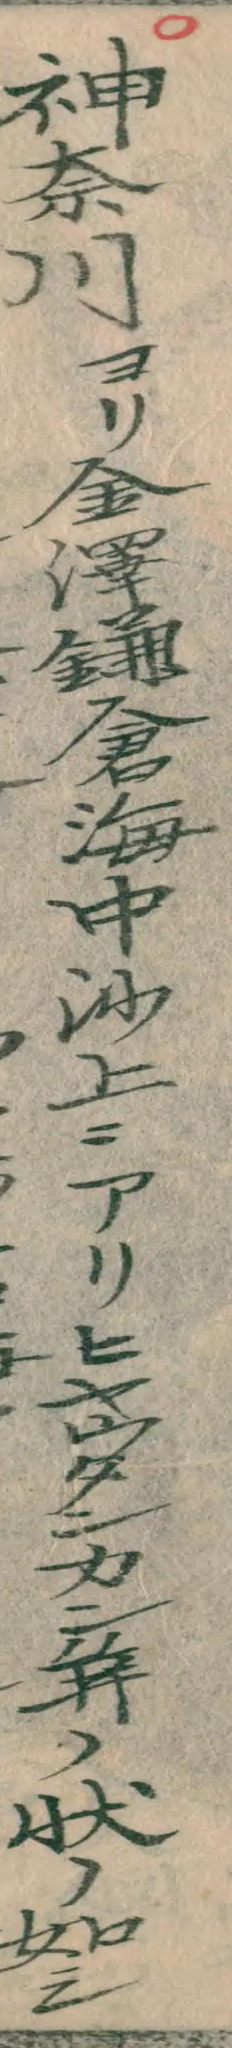○神奈川ヨリ金澤鎌倉海中沙上ニアリヒヤウタンカン笄ノ状ノ如シ
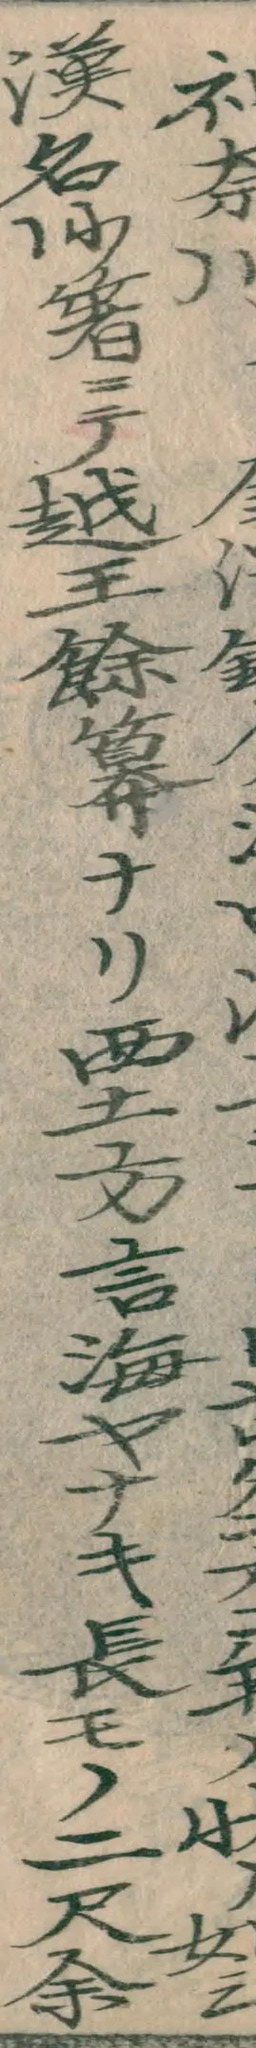漢名沙箸ニテ越王餘西土方言海ヤナキ長モノ二尺余
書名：千蟲譜 3巻. [1]
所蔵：国立国会図書館 National Diet Library, JAPAN
